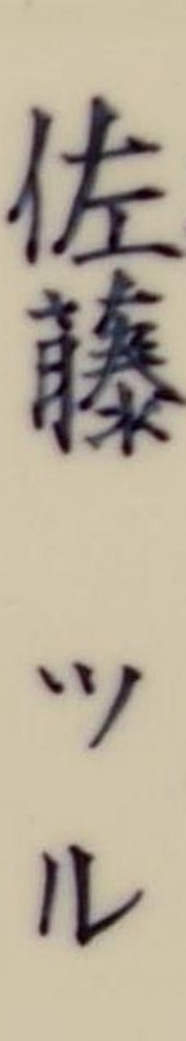佐藤ツル
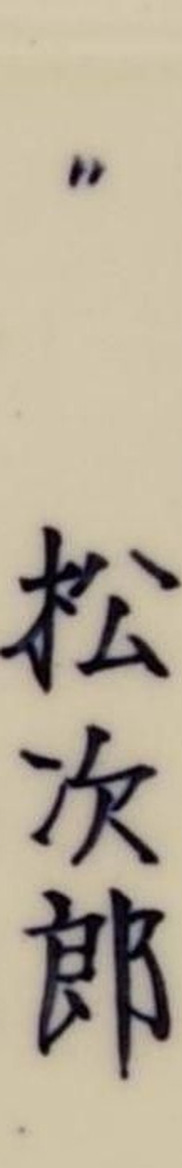松次郎
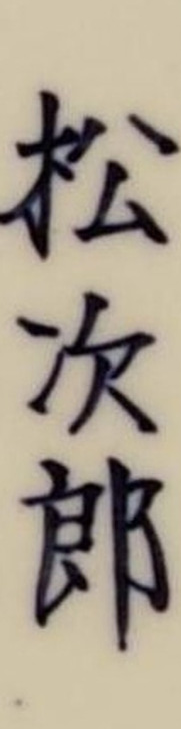松次郎
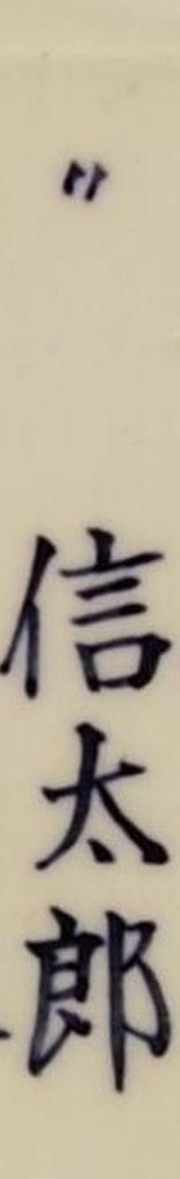信太郎
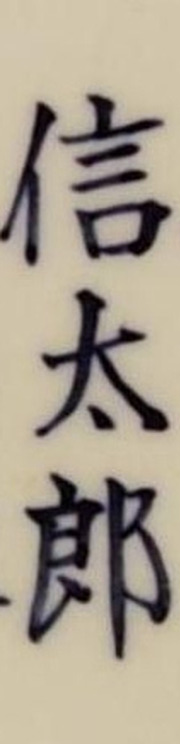信太郎
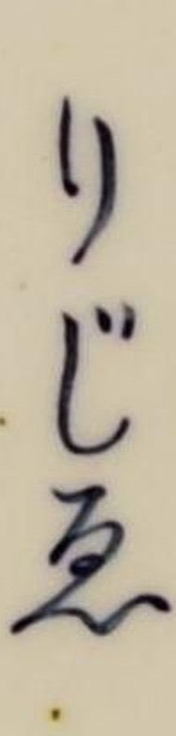りじえ
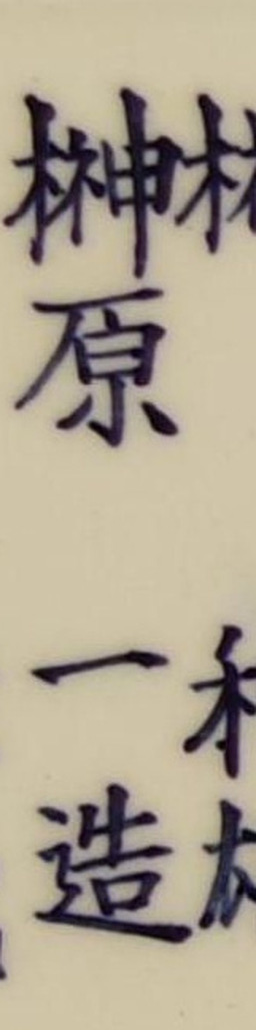榊原一造

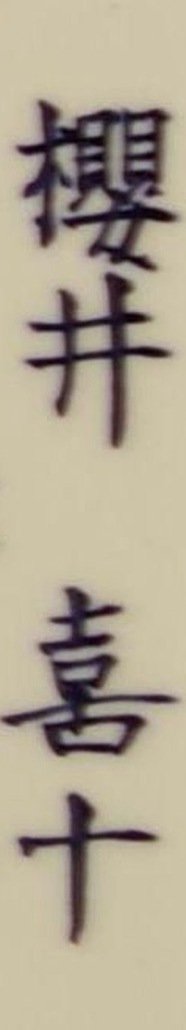桜井喜十
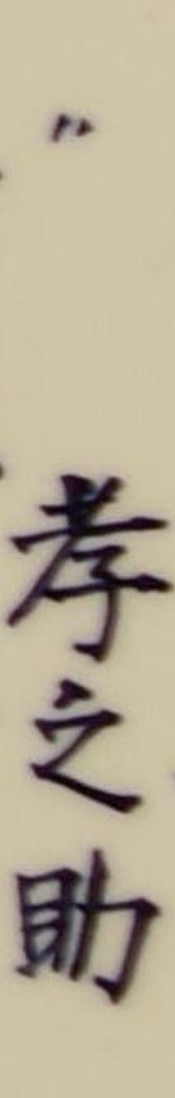孝之助
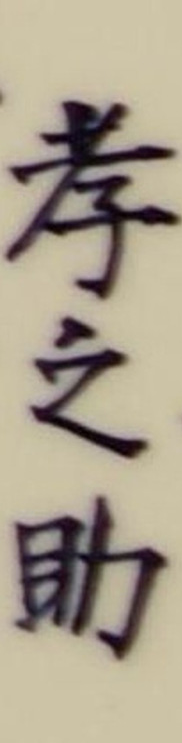孝之助
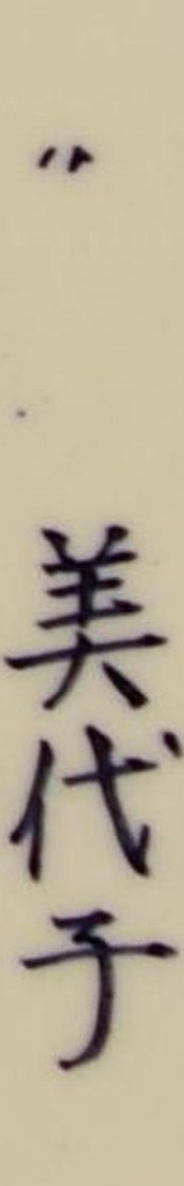美代子
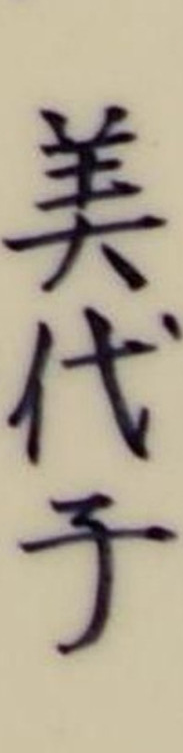美代子
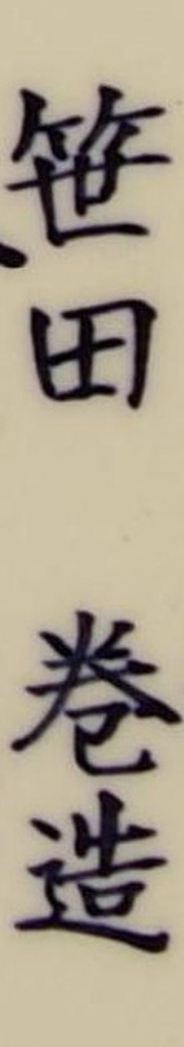笹田巻造
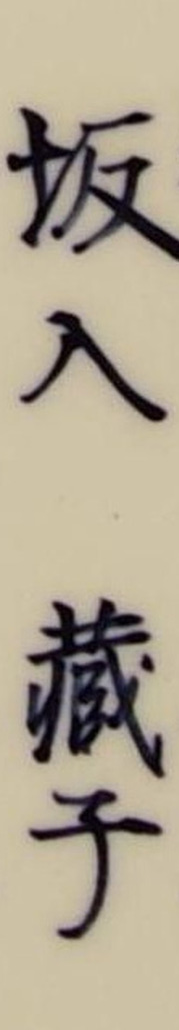坂入蔵子
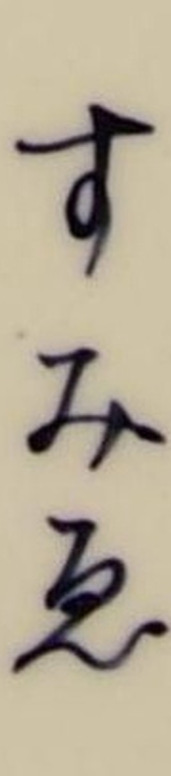すみえ
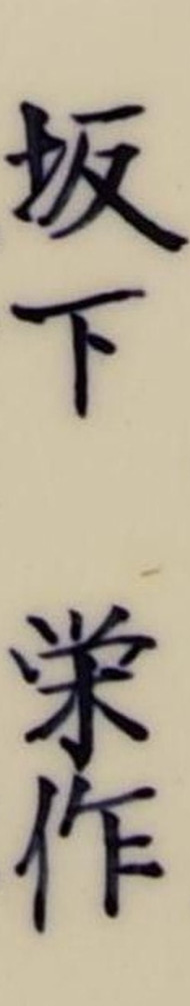坂下栄作
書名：E~L
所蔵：高野山金剛峯寺
